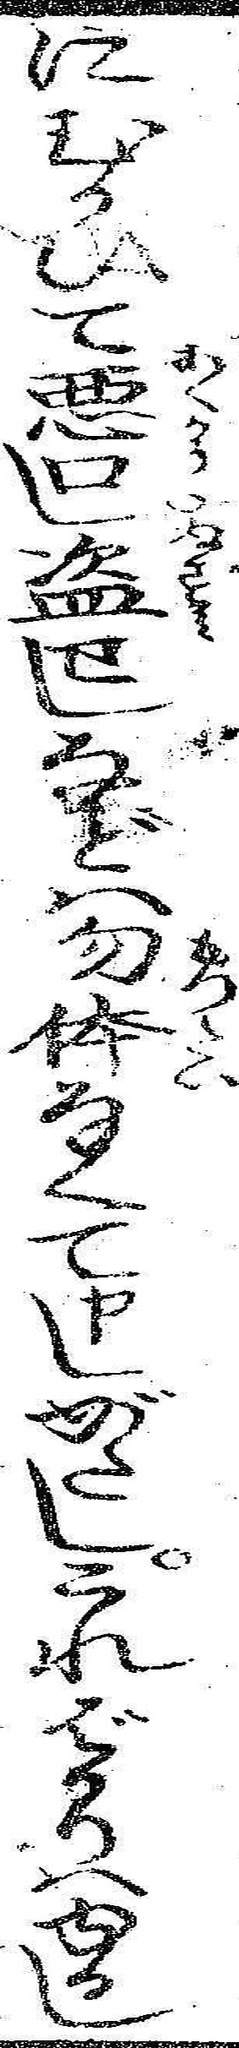にむかひて悪口し。盗せしなどは勿体なくて申しがたし。こればかりはゆるし
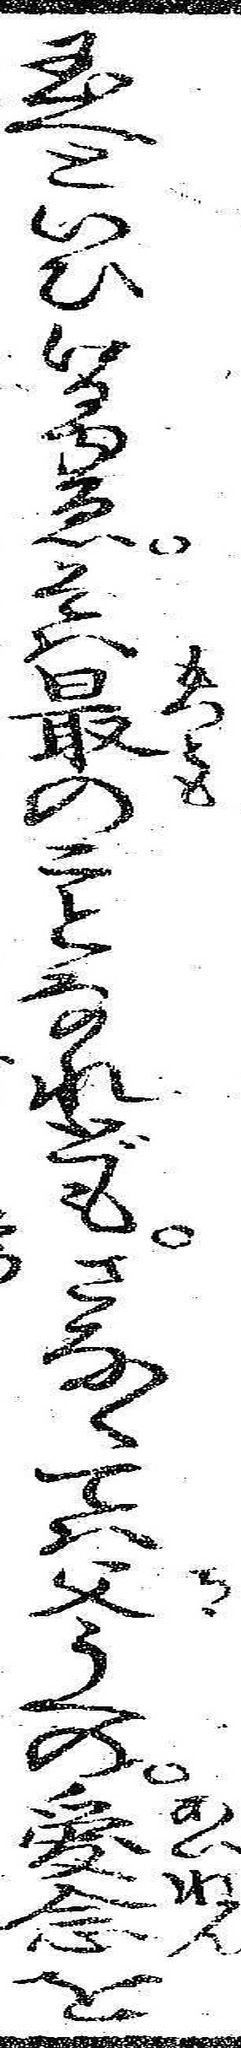玉へといひけるゆゑ。そは最のことなれども。さなくては父うへの。愛念を
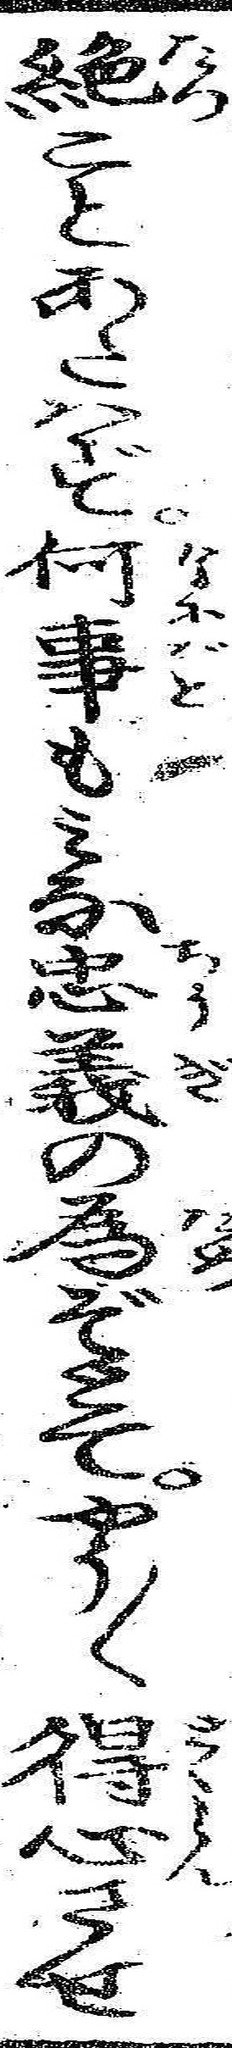絶ことあたはず。何事もみな忠義の為ぞとて。やう〳〵得心させ
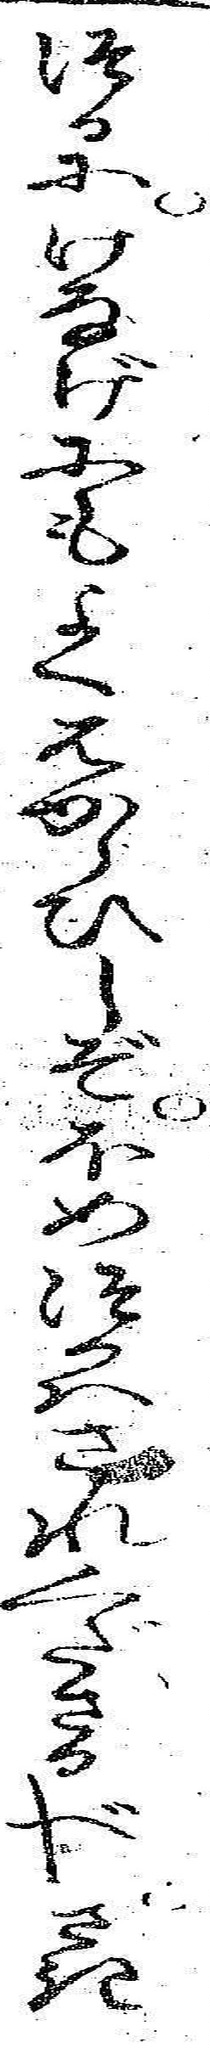つるに。けなげにもよくはからひしぞ。ほめつかはされくださるべし。さき
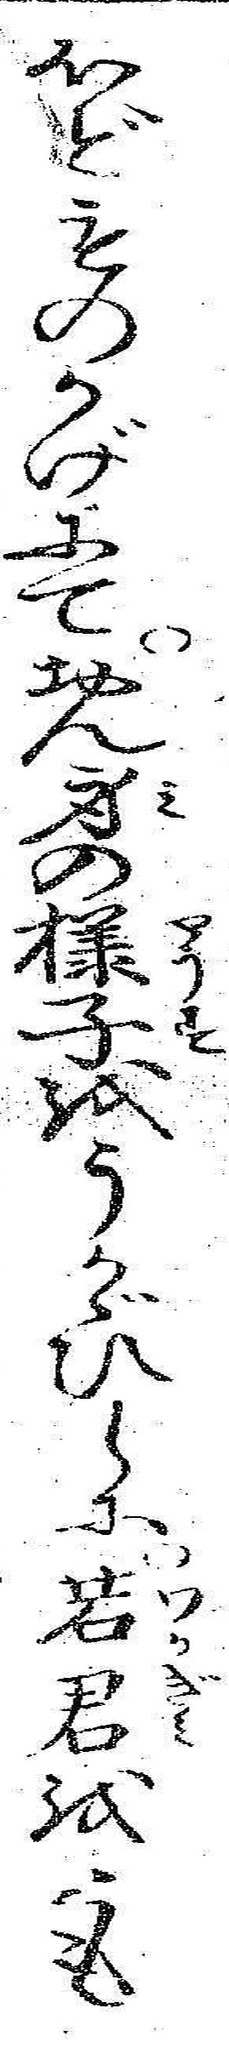ほどものかげにて。おん身の様子をうかゞひしに。若君をとも
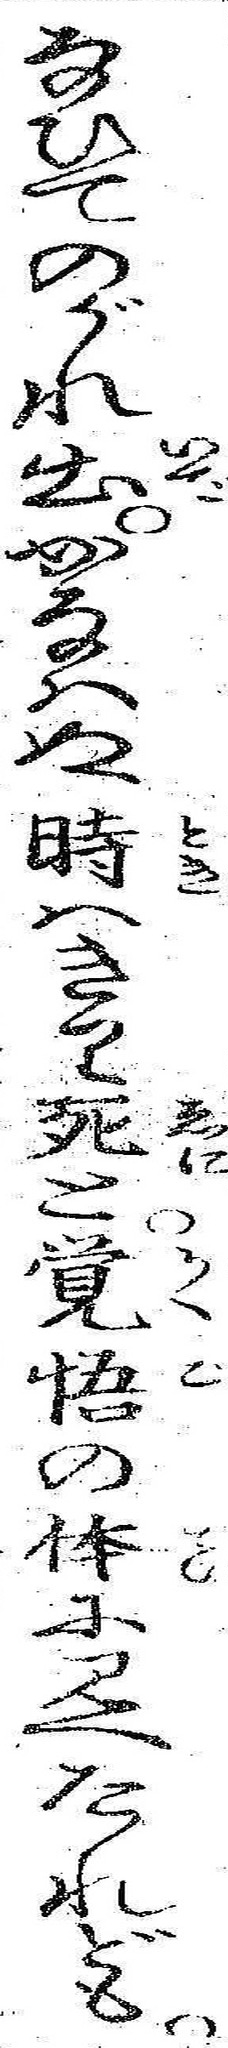なひてのがれ出。かなはぬ時はきり死と。覚悟の体に見へたれども。
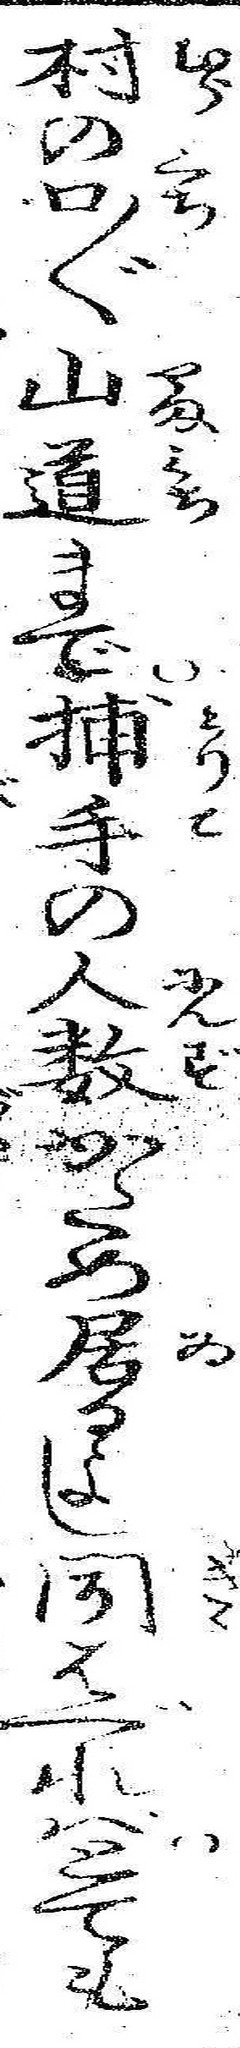村の口〴〵山道まで。捕手の人数かため居るよし聞はべれば。とても
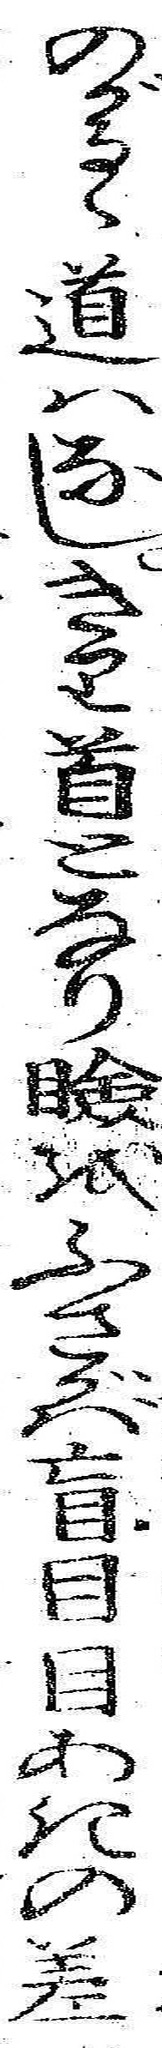のがるゝ道はなし。きり首となり瞼をふさがば。盲目目あきの差
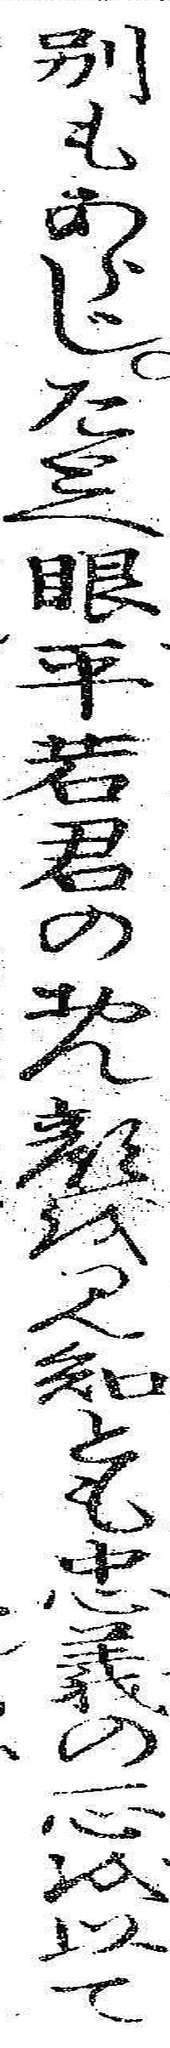別もあらじ。たとへ眼平若君のおん顔を見知とも。忠義の一心を以て
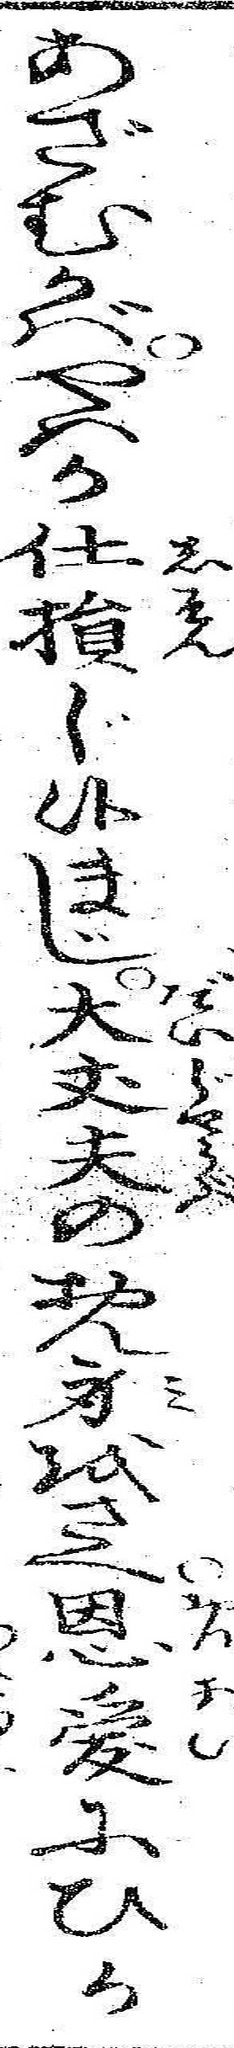あざむかば。やはり損じ候まじ。大丈夫のおん身をさへ。恩愛にひか
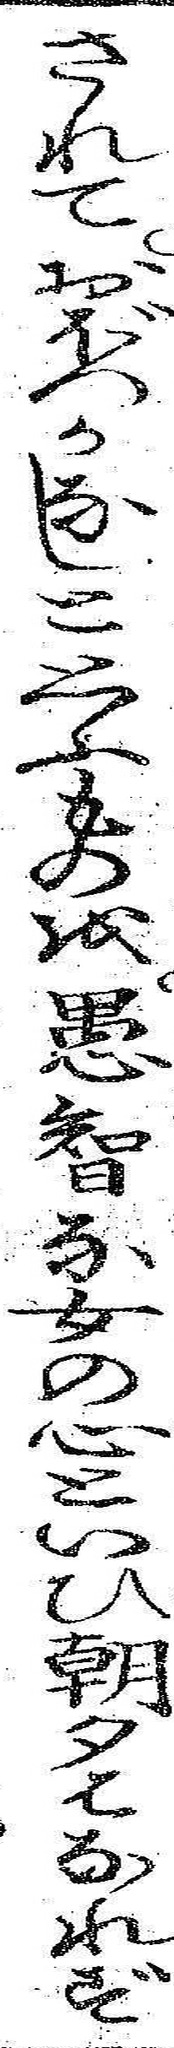されて。おぼつかなしと思ふものを。愚智な女の心といひ。朝夕はなれず
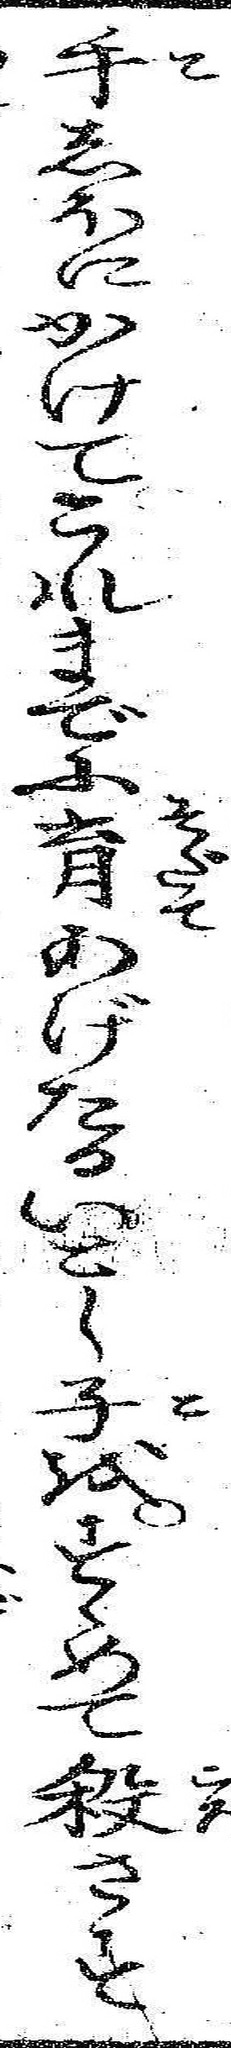手しほにかけて。これまでに育あげたるいとし子を。すゝめて殺さす
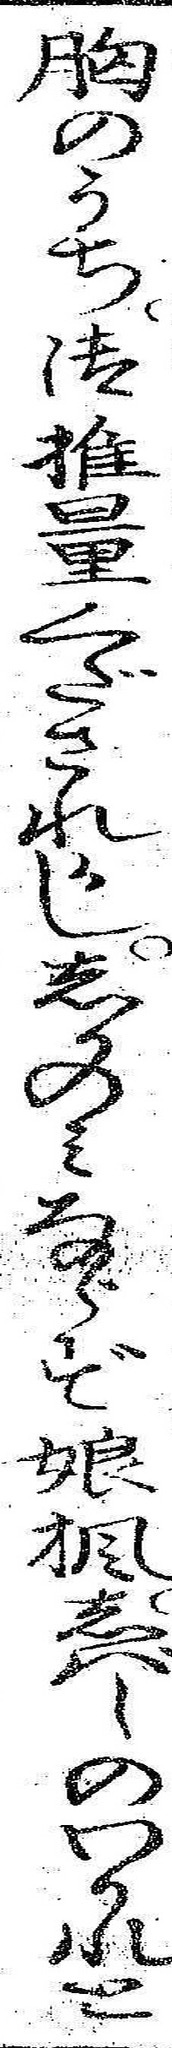胸のうち。御推量くだされかし。しかのみならず娘楓。しばしのわかれと
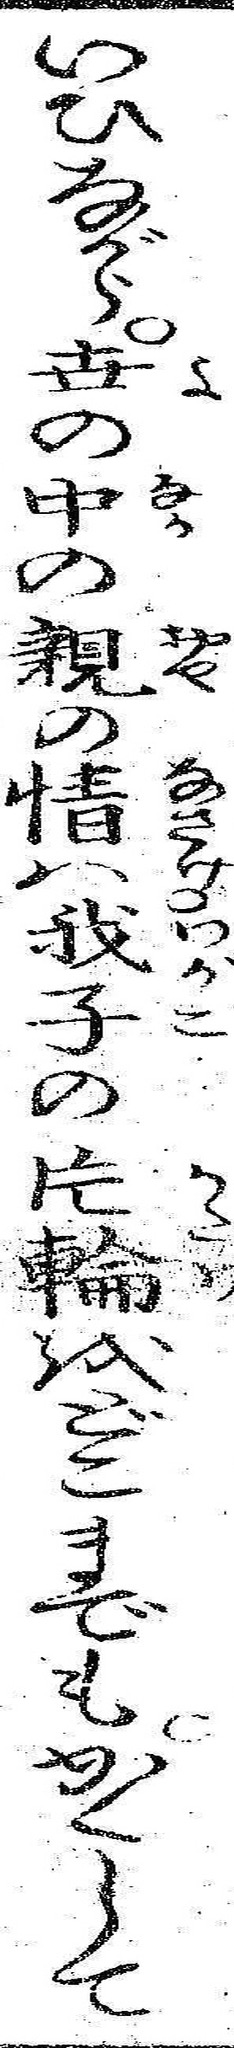いひながら。世の中の親の情は。我子の片輪をどこまでも。かくして

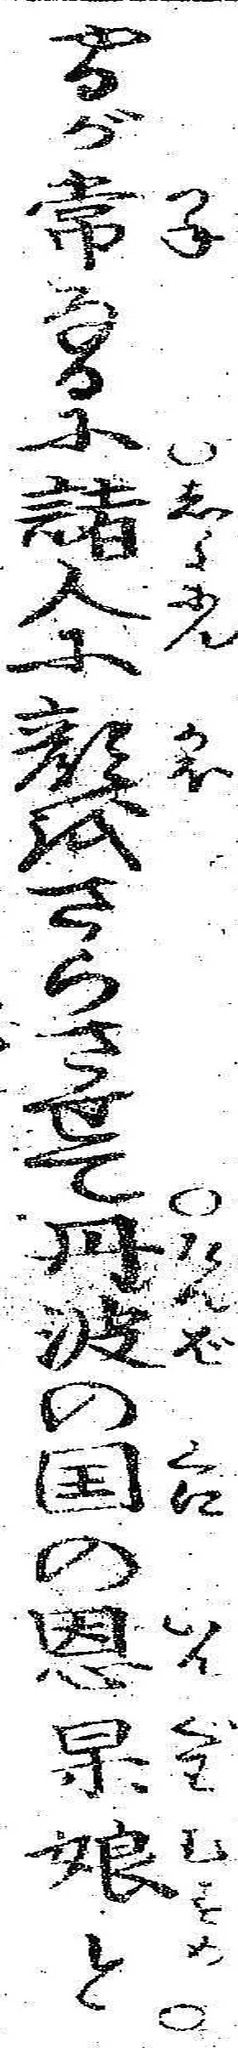やるが常なるに。諸人に顔をさらさせて。丹波の国の恩果娘と。
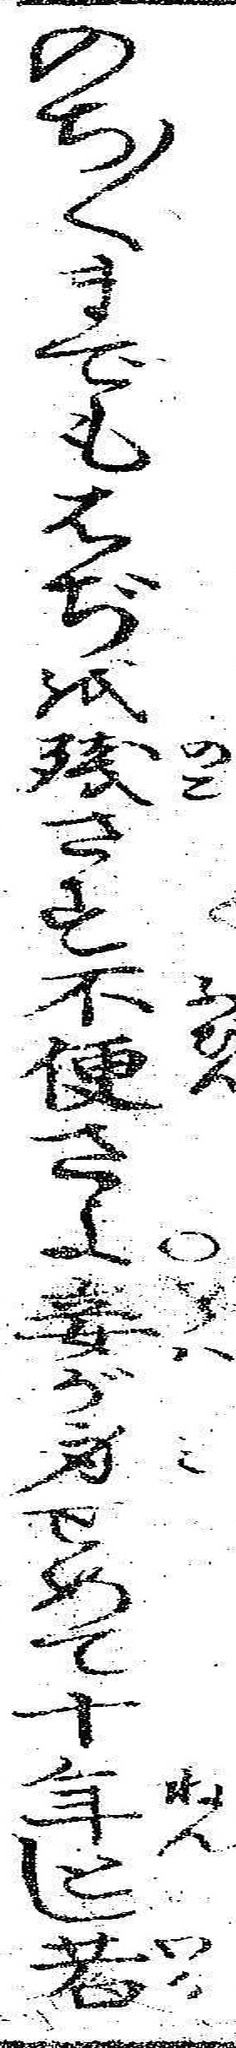のち〳〵までもはぢを残さす不便さよ。妾が身せめて十年とし若
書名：昔話稲妻表紙
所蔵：国文学研究資料館
